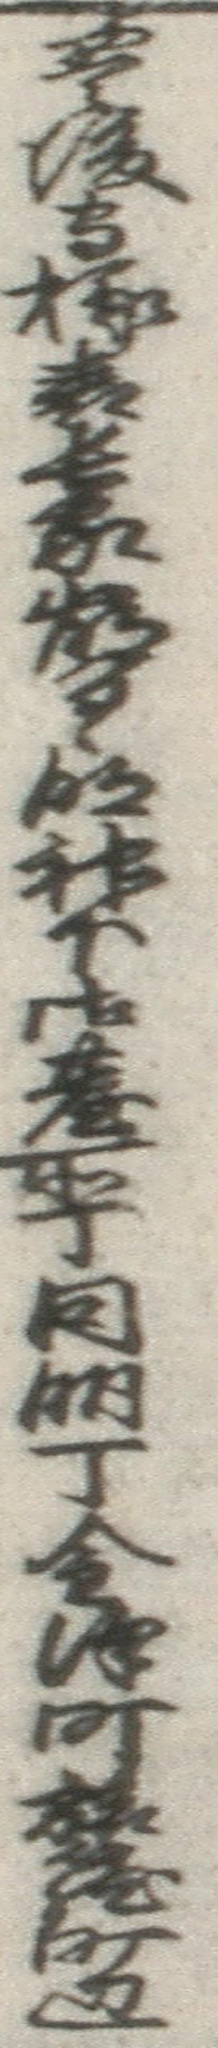豊後守様表長家崩るゝ明神下御台所丁同朋丁金沢町旅籠町辺
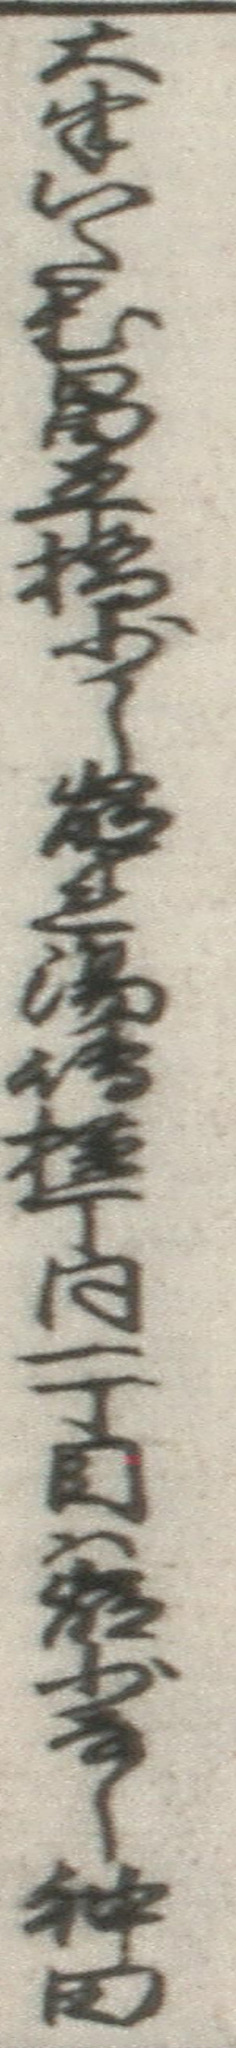大半いたむ昌平橋少し崩れ湯島横丁同一丁目ハ崩少なく神田
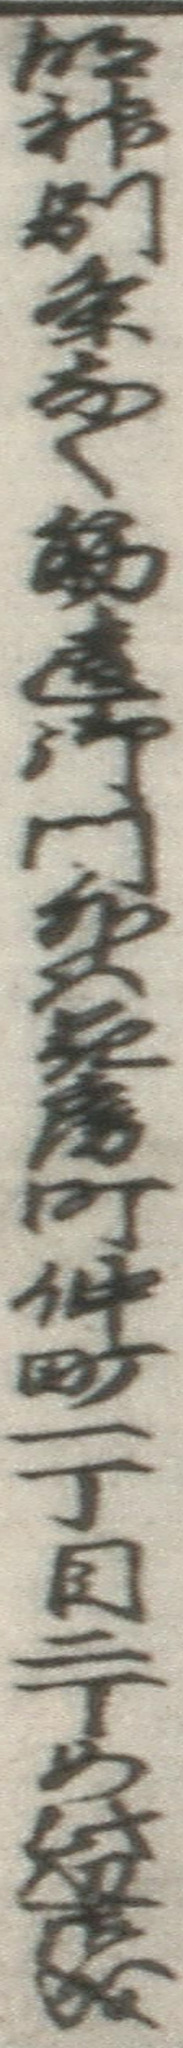明神別条なく筋違御門外ハ花房町仲町一丁目二丁め此辺御成
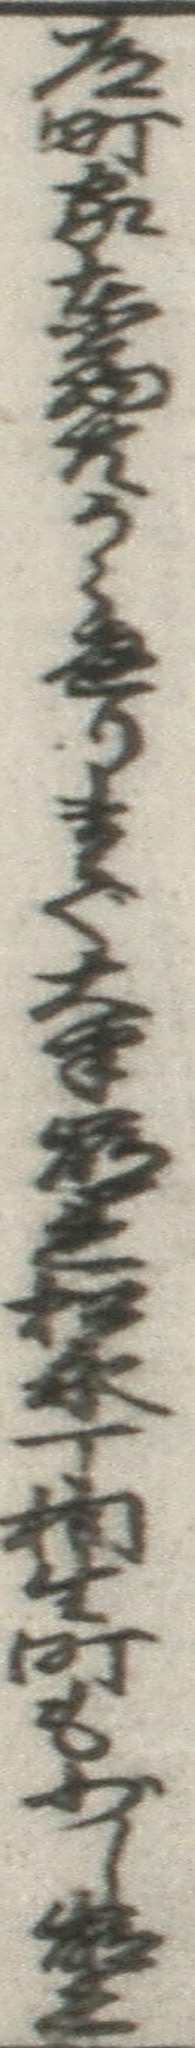道町家東西共うら通りまで大半崩れ松永丁相生町も少し崩れ
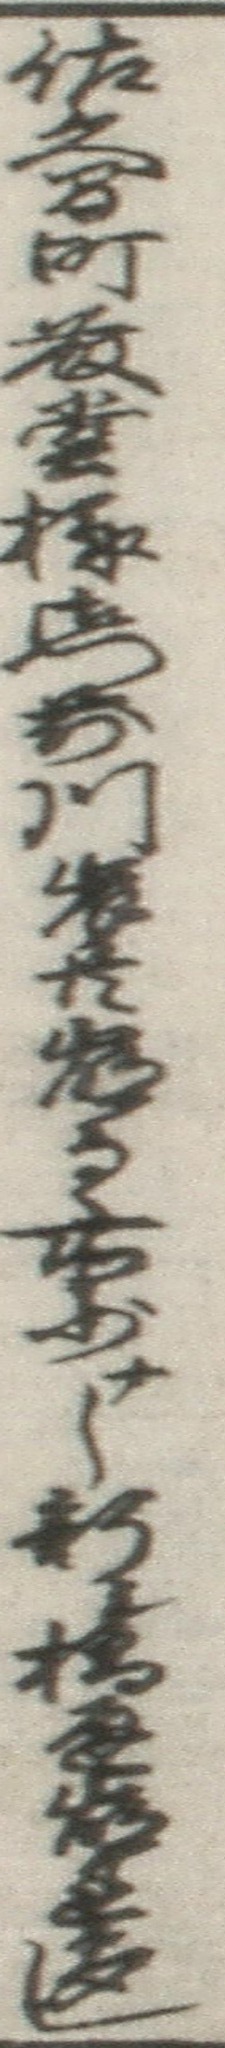佐久間町藤堂様御門前川岸共崩るゝ所少ナし新シ橋通崩れ多し
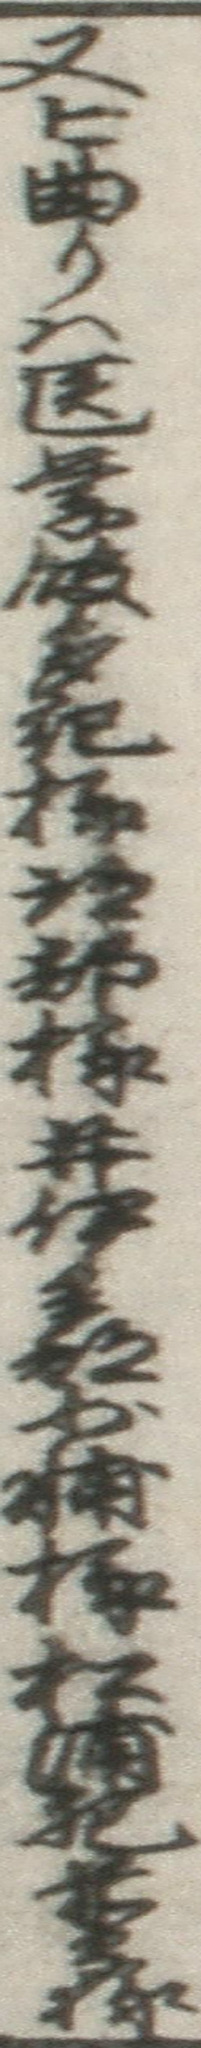又七曲りハ医学館多記様跡部様井伊兵部少輔様松浦肥前守様

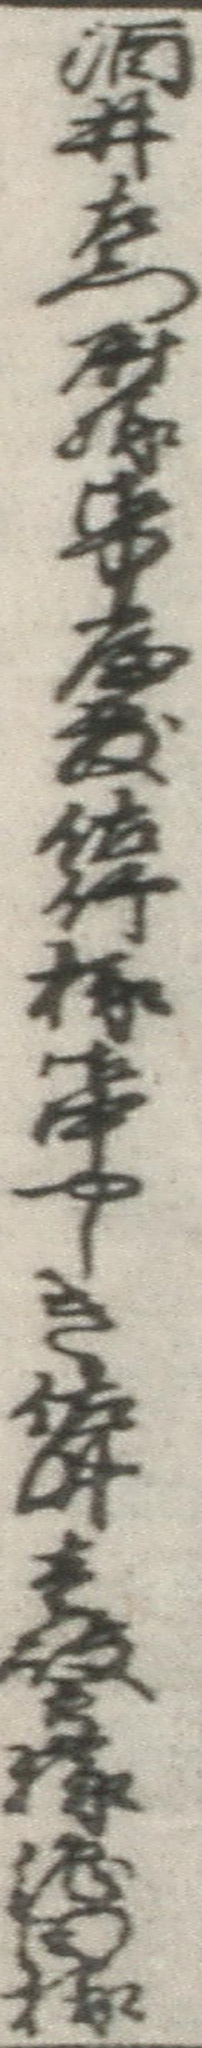酒井左衛門尉様御中屋敷佐竹様御中やしき佐竹壱岐守様池田様
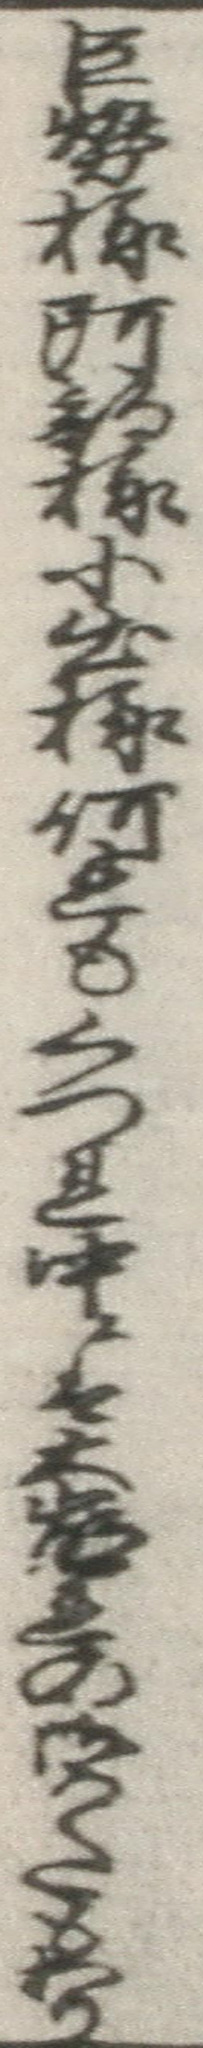巨勢様阿部様小出様何れもくつれ中ニは大崩れの御かたもあり
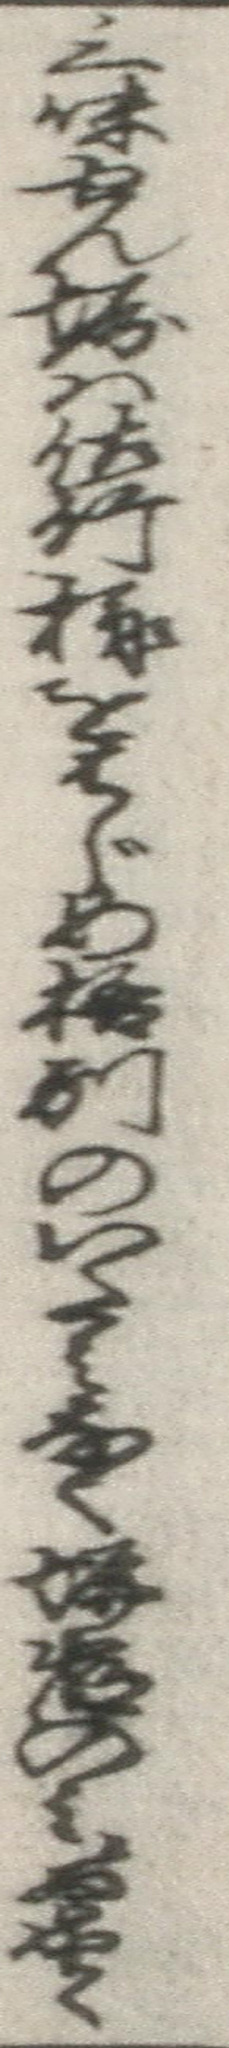三味せん堀ハ佐竹様をはじめ格別のいたミなく塀崩のミニ而御座候
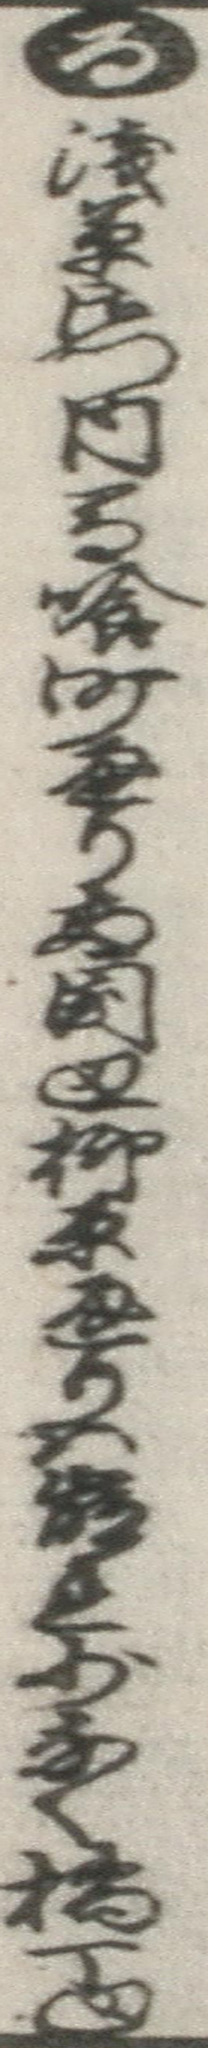る浅草御門内馬喰町通り両国辺柳原通りハ崩れ少なく橋丁辺
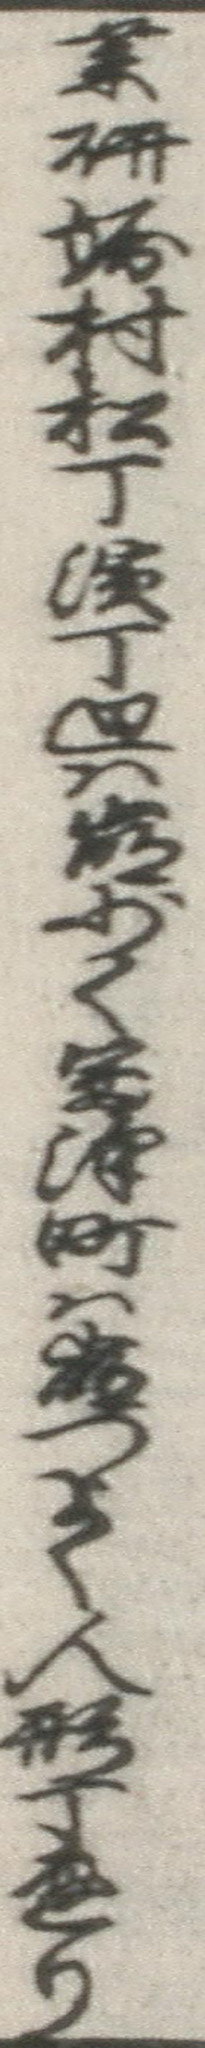薬研堀村松丁浜丁辺ハ崩少く富沢町ハ崩つよく人形丁通り
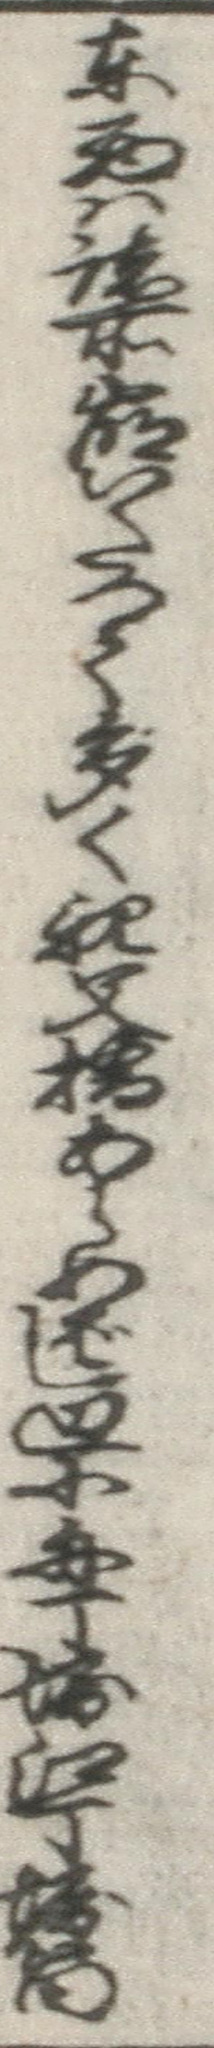東西ハ諸所崩いたつて多く親父橋あらめばし辺小舟丁堀江丁堀留
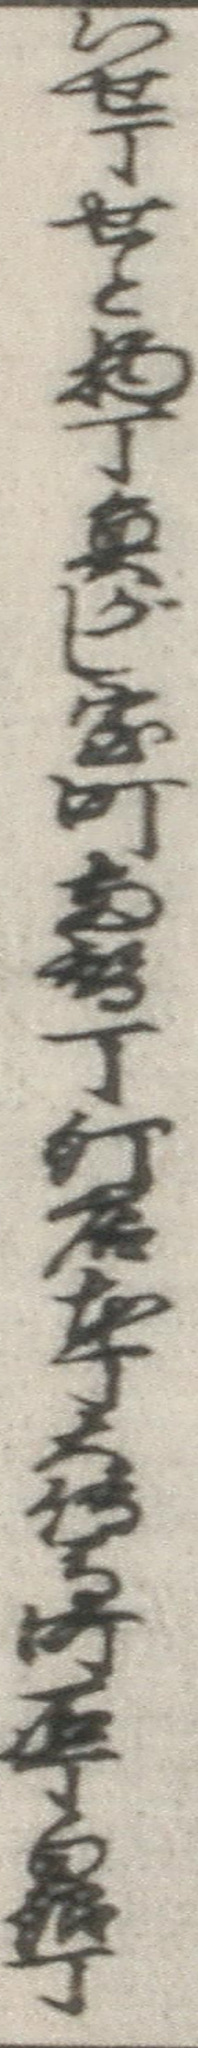いせ丁せと物丁魚がし室町両替丁釘店本丁大傳馬町石町白銀丁
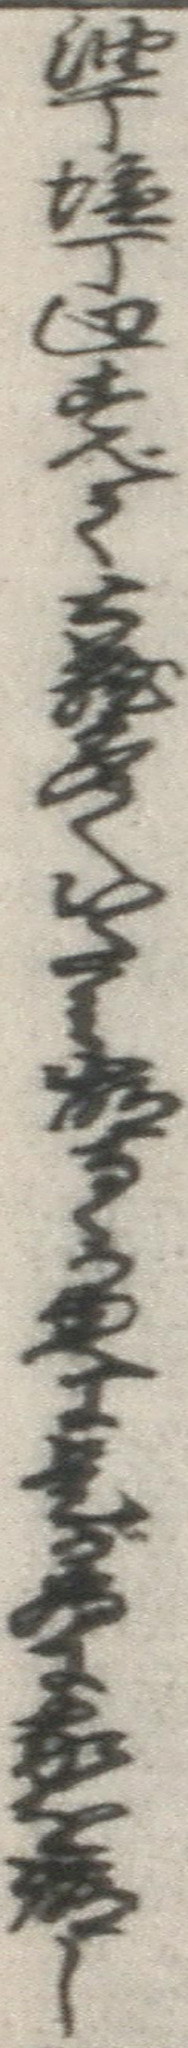油丁塩丁辺すべて土蔵多くいたミ崩るゝかゆへに是が為に家を崩し
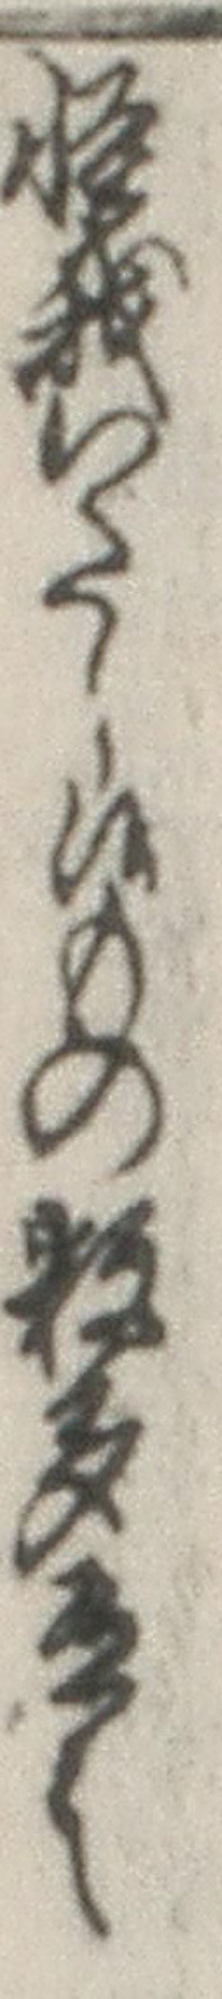怪我いたし候もの数多有之
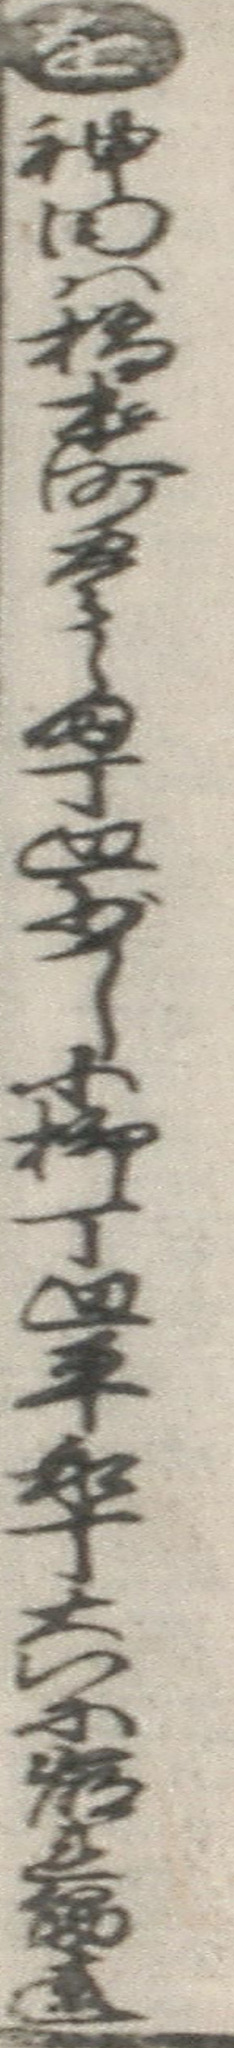を神田ハ橋本町豊しま丁辺少し小柳丁辺平永丁大いに崩れ筋違
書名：大地震焼場細見記
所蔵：東京大学地震研究所図書室 Earthquake Research Institute Library, The University of Tokyo, JAPAN
